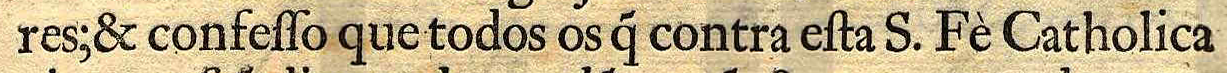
res, & confesso que todos os q̄ contra esta S. Fè Catholica
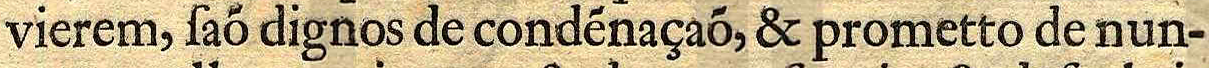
vierem, saõ dignos de condenaçaõ, & prometto de nun
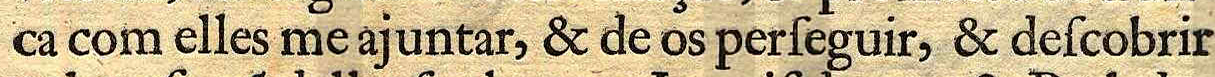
ca com elles me ajuntar, & de os perseguir, & descobrir
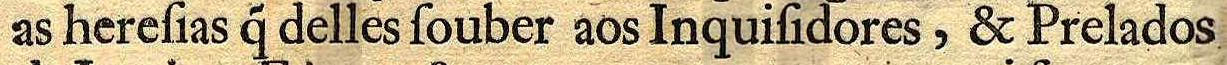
as heresias q̄ delles souber aos Inquisidores, & Prelados
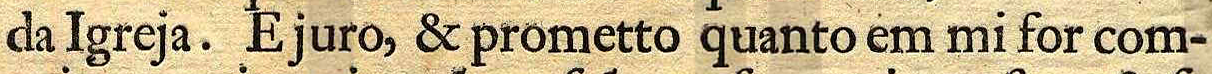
da Igreja. E juro, & prometto quanto em mi for com
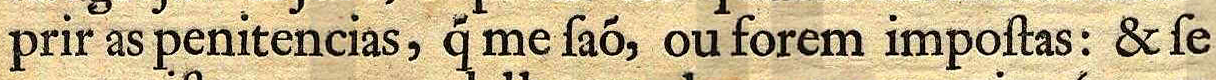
prir as penitencias, q̄ me saõ, ou forem impostas: & se
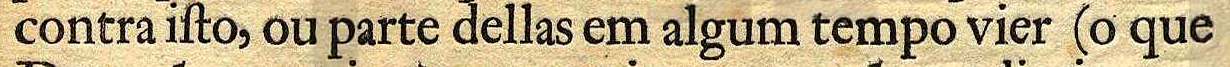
contra isto, ou parte dellas em algum tempo vier (o que
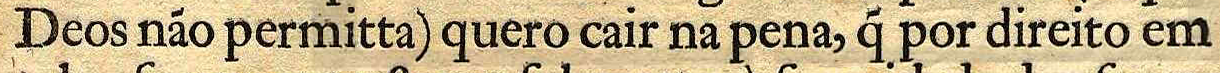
Deos não permitta) quero cair na pena, q̄ por direito em
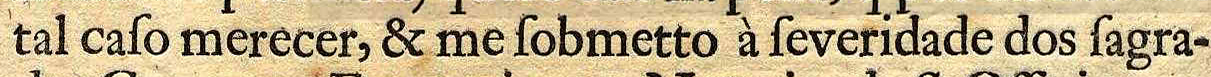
tal caso merecer, & me sobmetto à severidade dos sagra
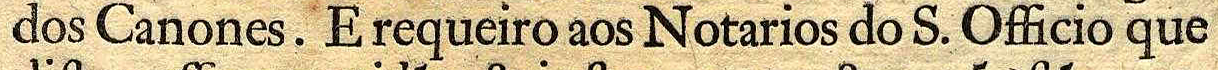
dos Canones. E requeiro aos Notarios do S. Officio que
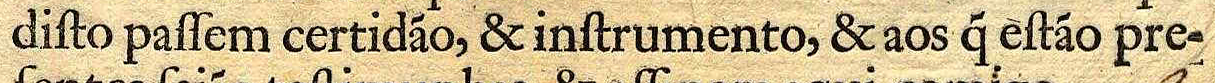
disto passem certidão, & instrumento, & aos q̄ estão pre
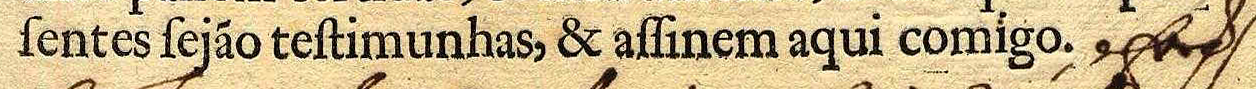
sentes sejão testimunhas, & assinem aqui comigo; e foraõ
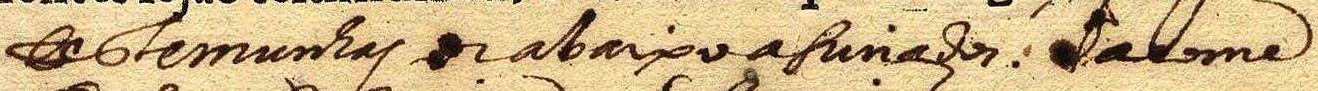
testemunhas os abaixo assinados. Iacome
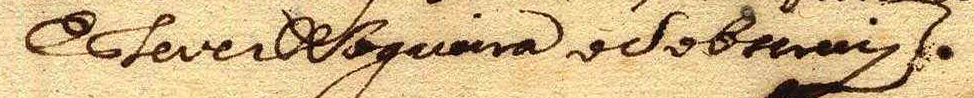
Esteves Nogueira o Sobscrevy.
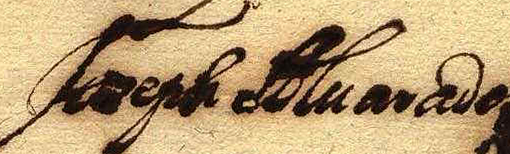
Jozeph Aluarado
